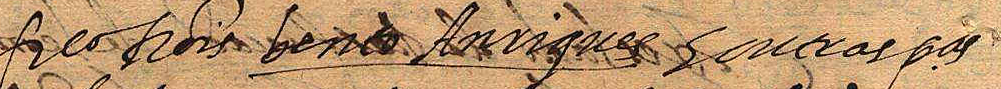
frco Rois̄ bento Anriques E outras p.as
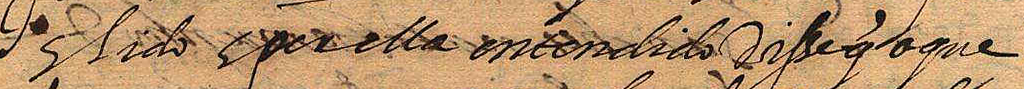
E lido E por ella entendido disse q̄ o que
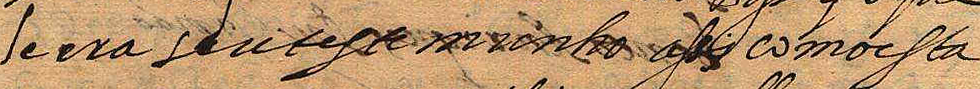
se era seu testemunho assi como esta
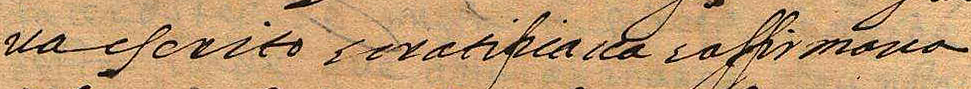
ua escrito E ratificaua E affirmaua
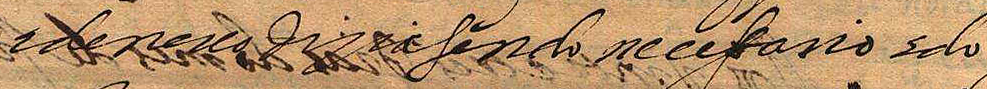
E de nouo dizia sendo necessario E do
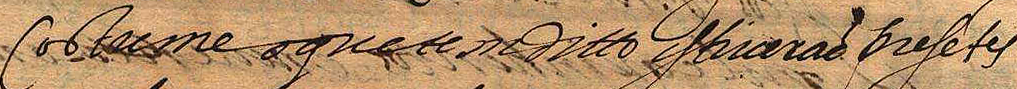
Costume o que tem ditto estiueraõ presētes
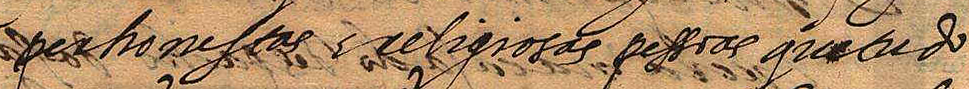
por honestas E religiosas pessoas que tudo
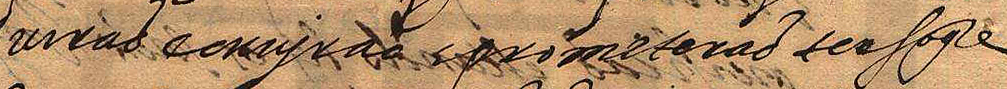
uiraõ e ouujraõ E prometeraõ ter segre
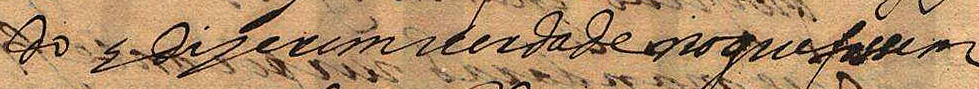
do E dizerem uerdade no que fossem
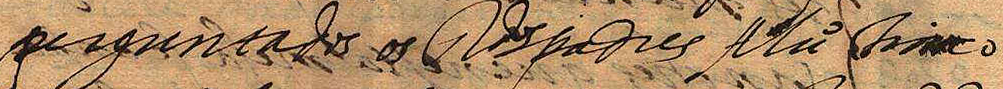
perguntados os Rdos padres Aluo tinoco
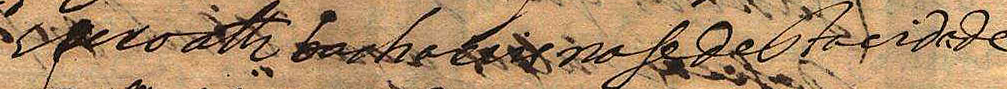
E pero all̄z bachareis na se desta cidade
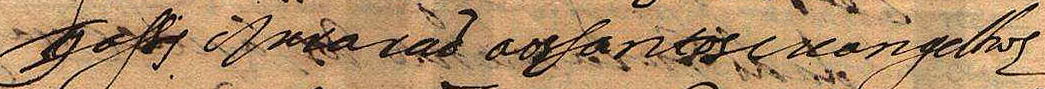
q̄ assy o juraraõ aos santos euangelhos
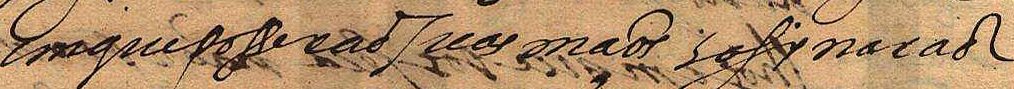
em que posseraõ suas maõs E asynaraõ
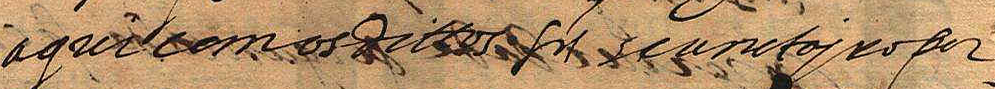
aqui com os dittos srs̄ E eu notajro por
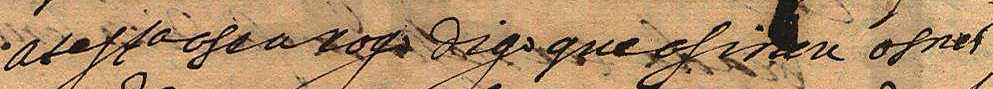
a testa oje a rogo digo que asinou o snor̄
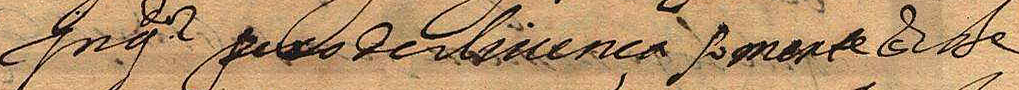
jnq.dor pero de oliuença somente q̄ este
